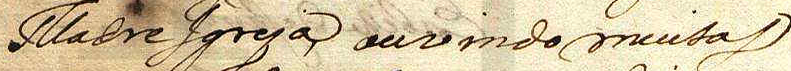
Madre Jgreja, ouvindo muitas
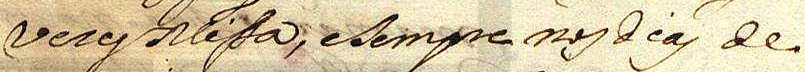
vezes Missa, e sempre nos dias de
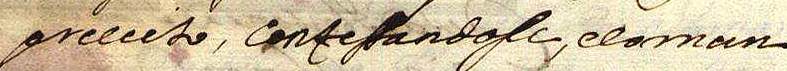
preceito, confessandosse, e comun
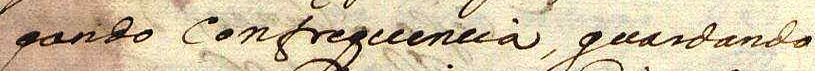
gando con frequencia, guardando
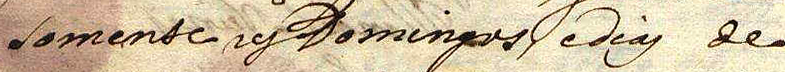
somente os Domingos, e dias de
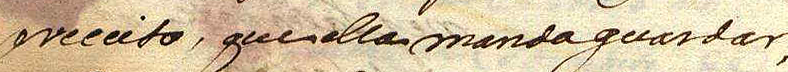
preceito, que ella manda guardar,
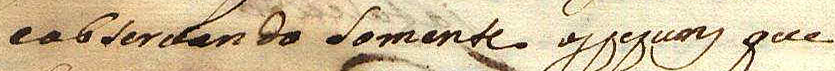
e observando somente os jejuns que
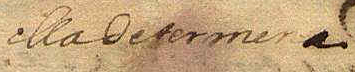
ella determina
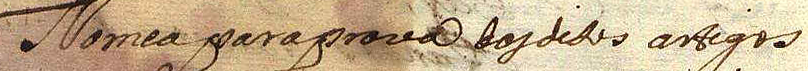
Nomea para prova dos ditos artigos
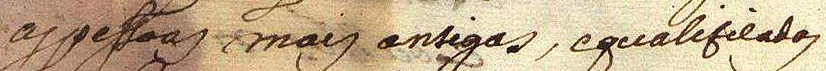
as pessoas mais antigas, e qualificadas
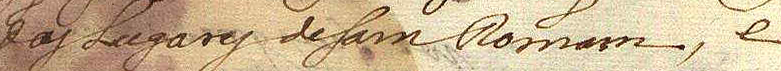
dos Lugares de sam Romam, e
